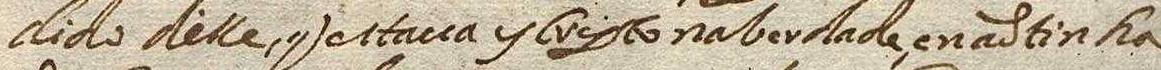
dido disse, q̄ estaua esCripto na verdade, e naõ tinha
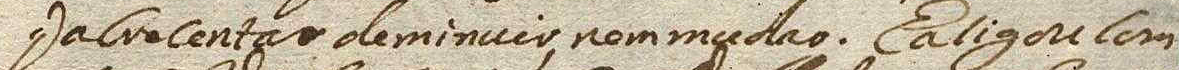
q̄ aCrecentar deminuir, nem mudar. E asigou Com
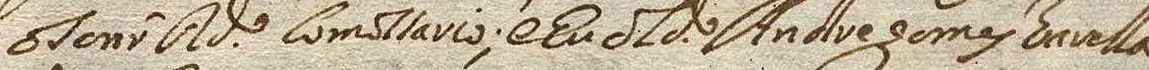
o Senr̄ Rd.o Comossario; e Eu o Ld.o Andre gomes Varella
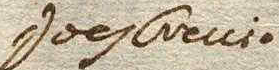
q̄ o esCreui.
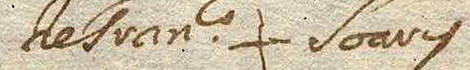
de Franco. + Soares
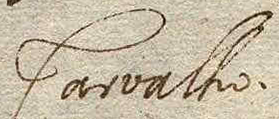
Carvalho.
